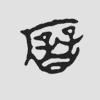{厂孖日}
